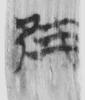隹
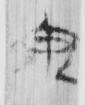余
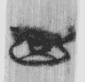𠀠
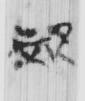卹
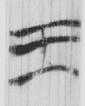王
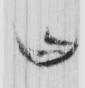曰
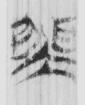{聑大}
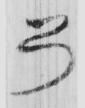乃
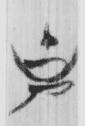克
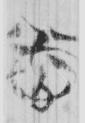悉
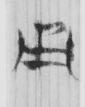甬
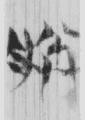朕
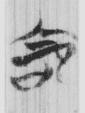命
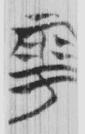𩁹
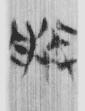朕
